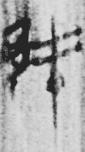邦
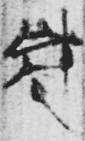風
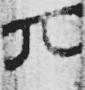亓（其）
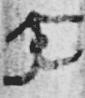內
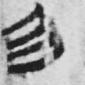勿（物）
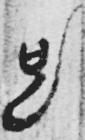也
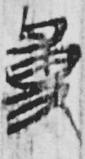尃（博）
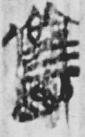○（觀）
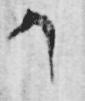人
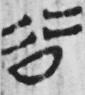谷（俗）
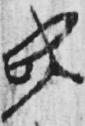𡚦（焉）
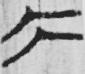大
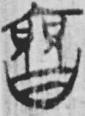噞（敛）
